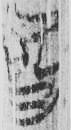智（知）
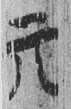亓（其）
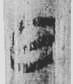白
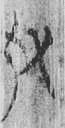夂（終）
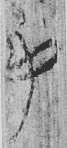身
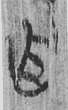自
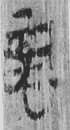若
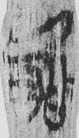能
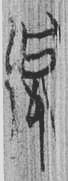○（寡）
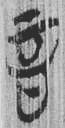言
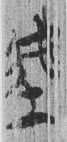○（乎）
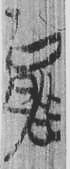能
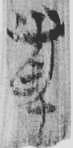○（一）
